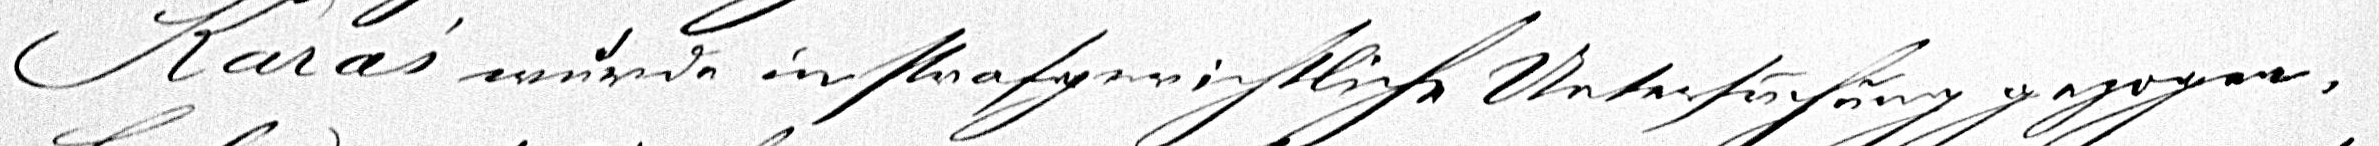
Karaś wurde in Strafgerichtliche Untersuchung gezogen.
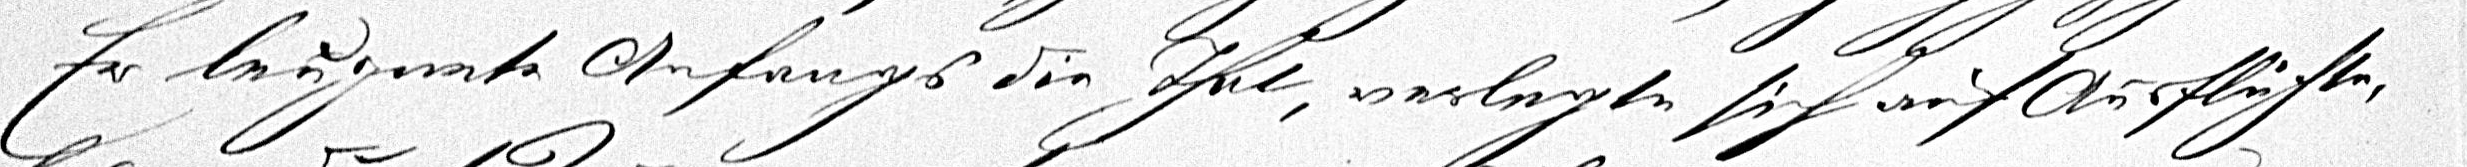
Er leugnete Anfangs die That, verlegte sich auf Ausflüchte,
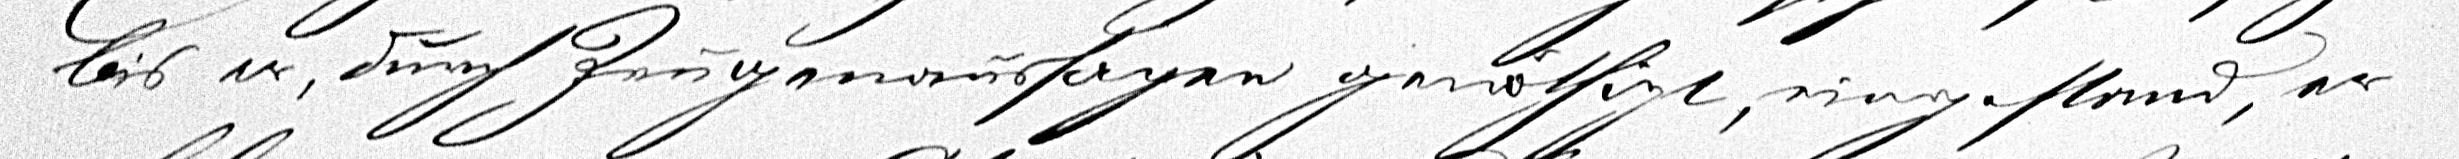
bis er, durch Zeugenaussagen genöthigt, eingestand, er
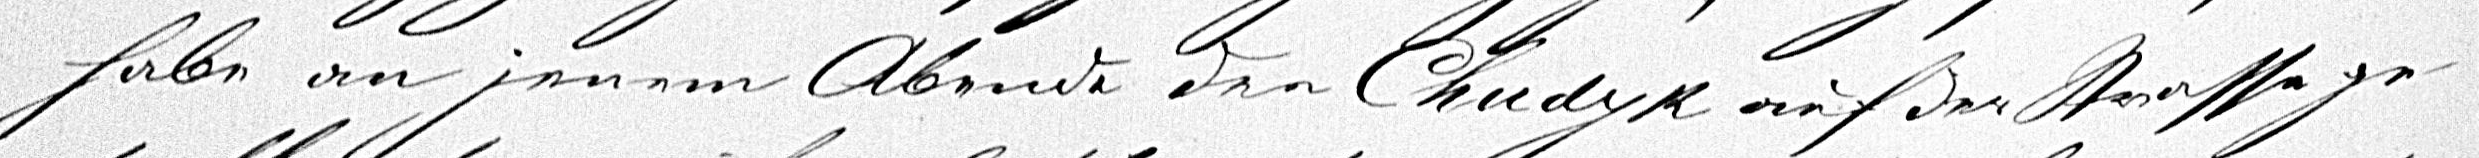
habe an jenem Abende den Chudyk auf derStrasse ge
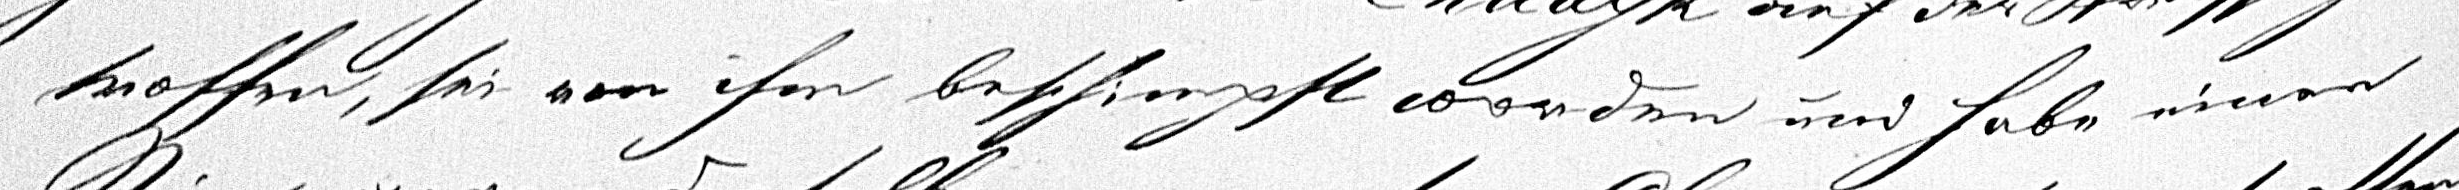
troffen, sei von ihm beschimpft worden und habe einen
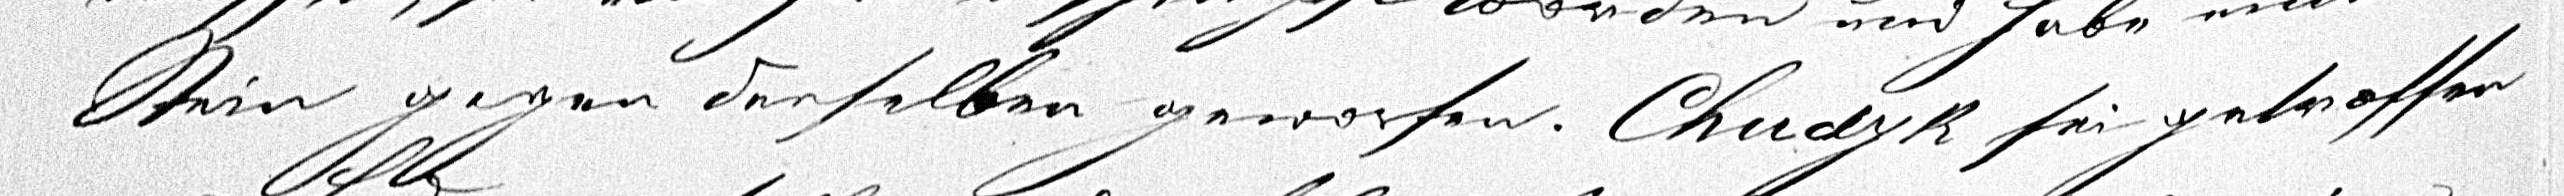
Stein gegen denselben geworfen. Chudyk sei getroffen
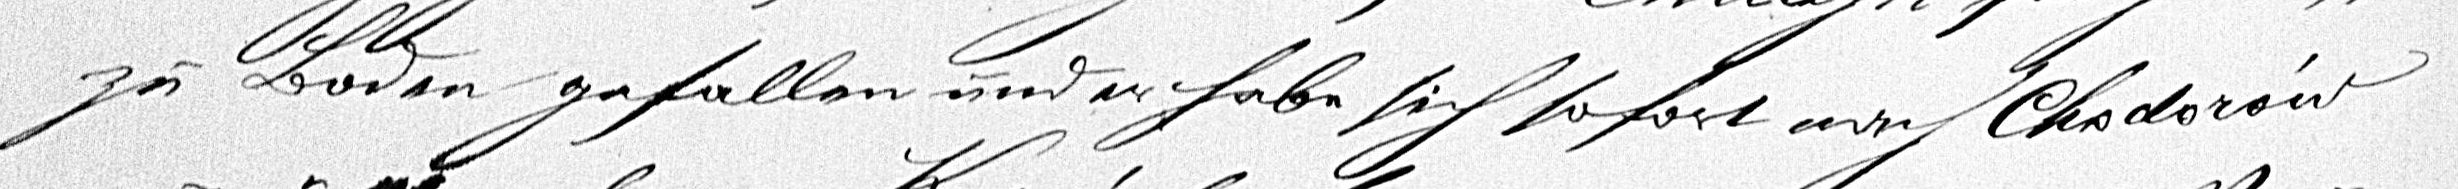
zu Boden gefallen und er habe sich sofort nach Chodorów¬
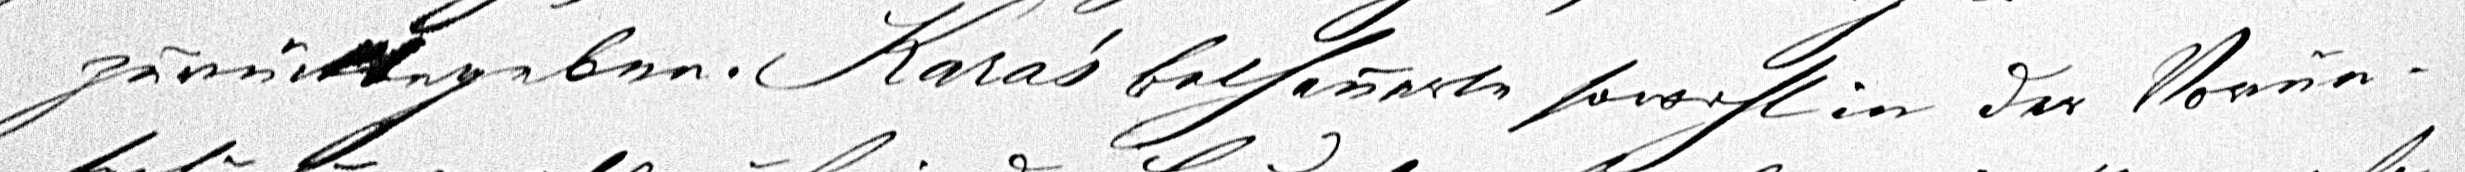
zurückbegeben. Karaśbetheuerte sowohl in der Vorun¬
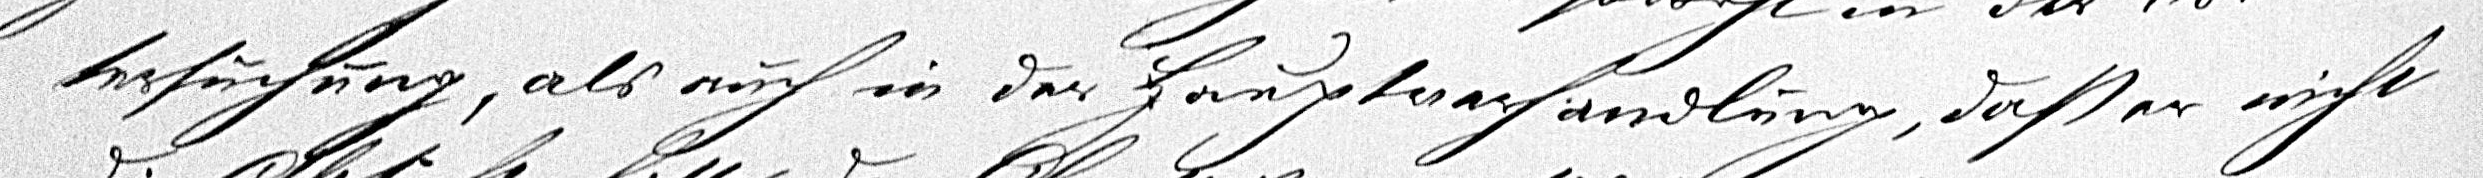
tersuchung, als auch in der Hauptverhandlung, daß er nicht
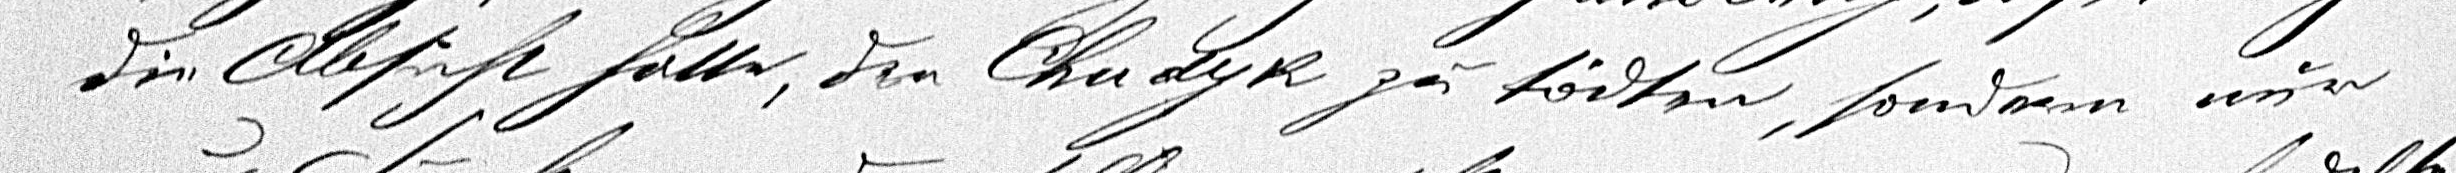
die Absicht hatte, den Chudyk zu tödten, sondern nur
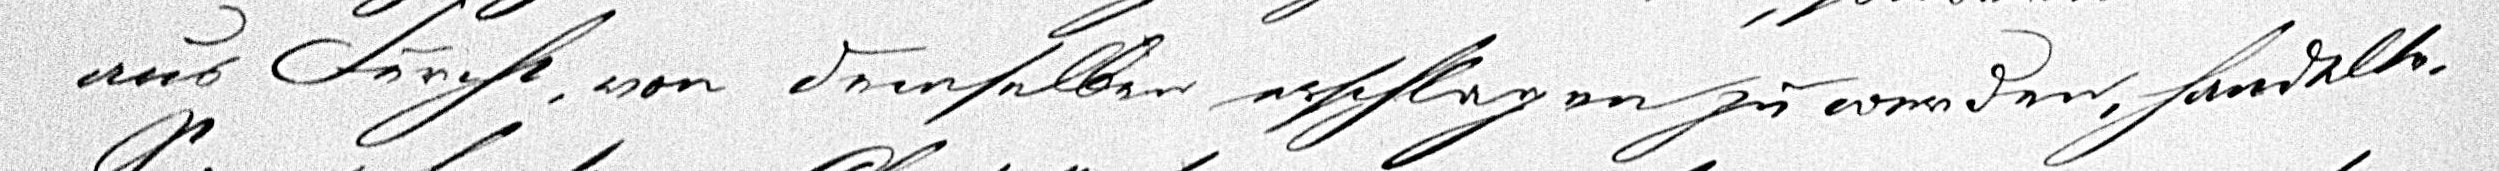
aus Furcht, von demselben erschlagen zu werden, handelte.
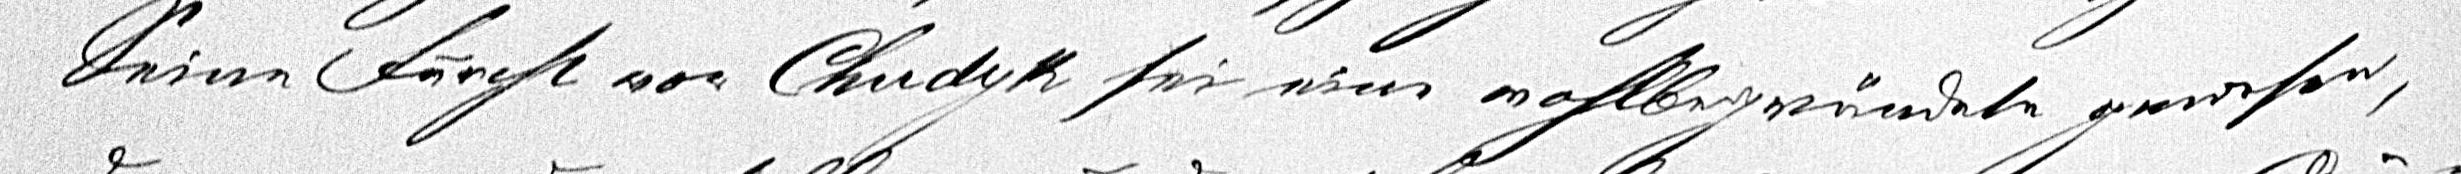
Seine Furcht vor Chudyk sei eine wohlbegründete gewesen,
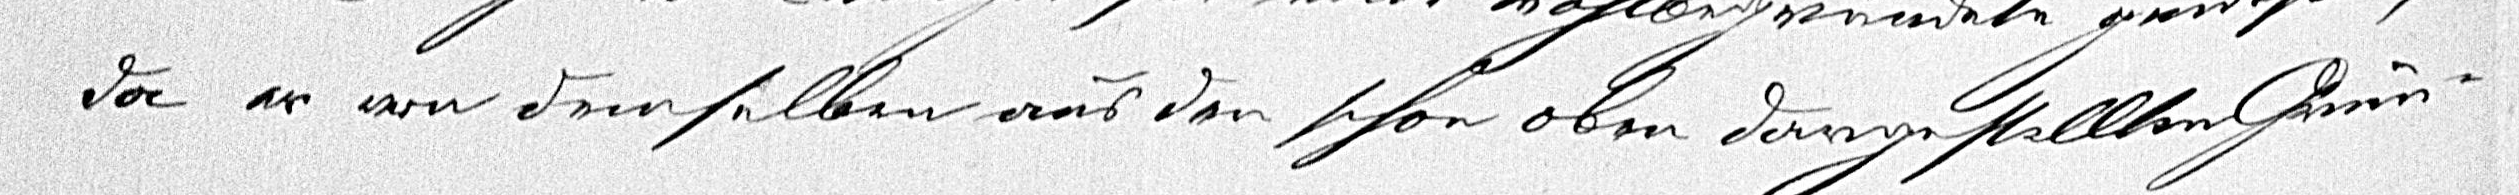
da er von demselben aus der schon oben dargestellten Grün¬
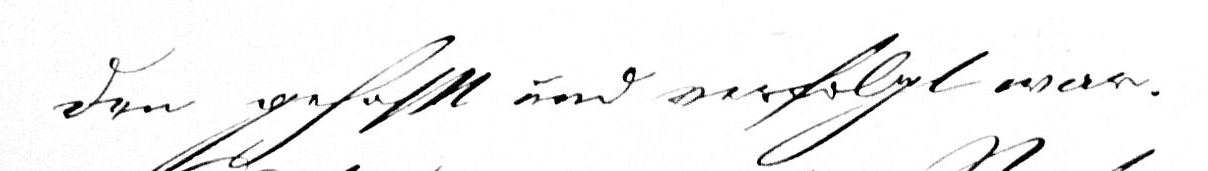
den gehasst und verfolgt war.
